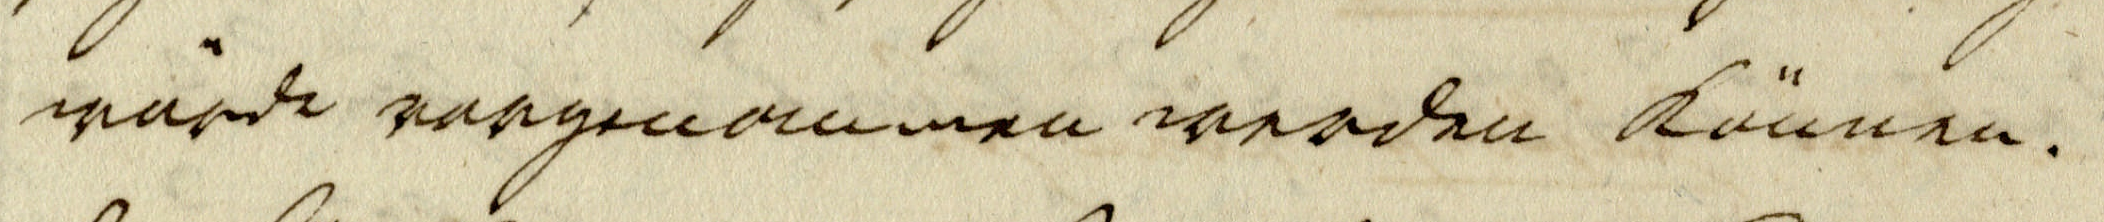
würde vorgenommen werden können.
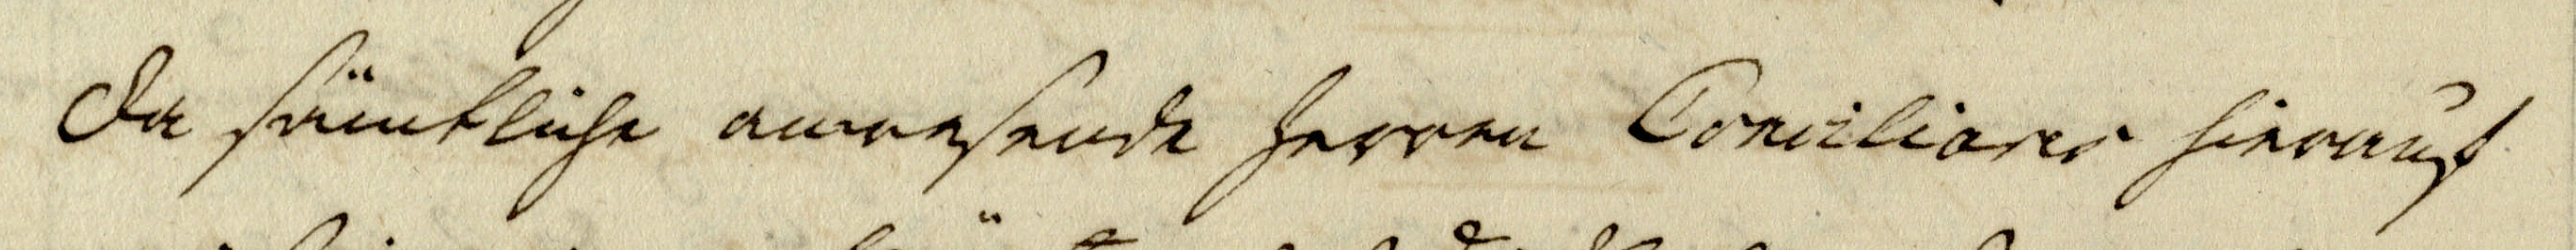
Da sämtliche anwesende Herren Conciliares hierauf
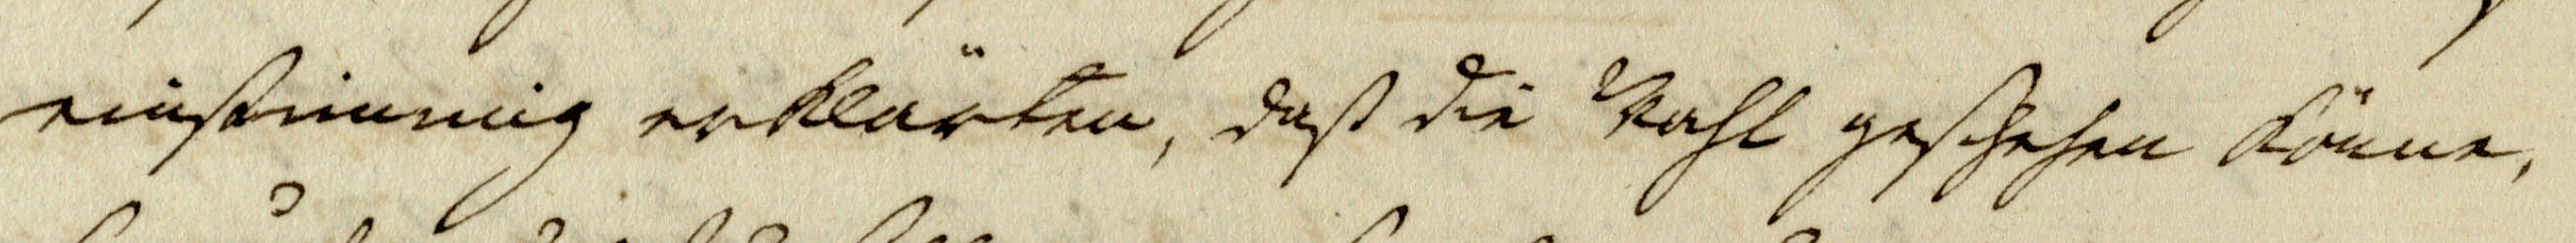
einstimmig erklärten, daß die Wahl geschehen könne,
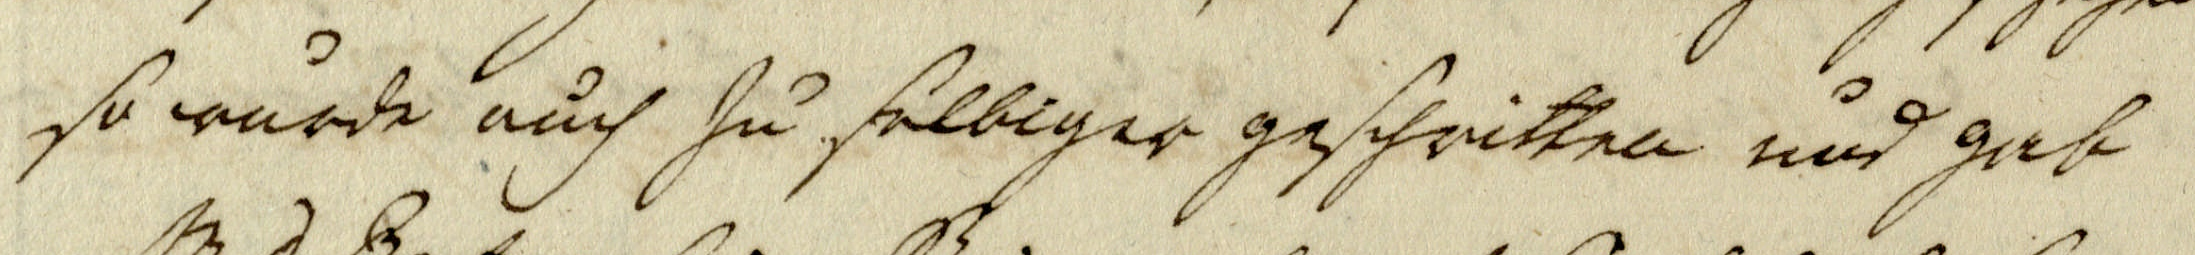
so würde auch zu selbiger geschritten und gab
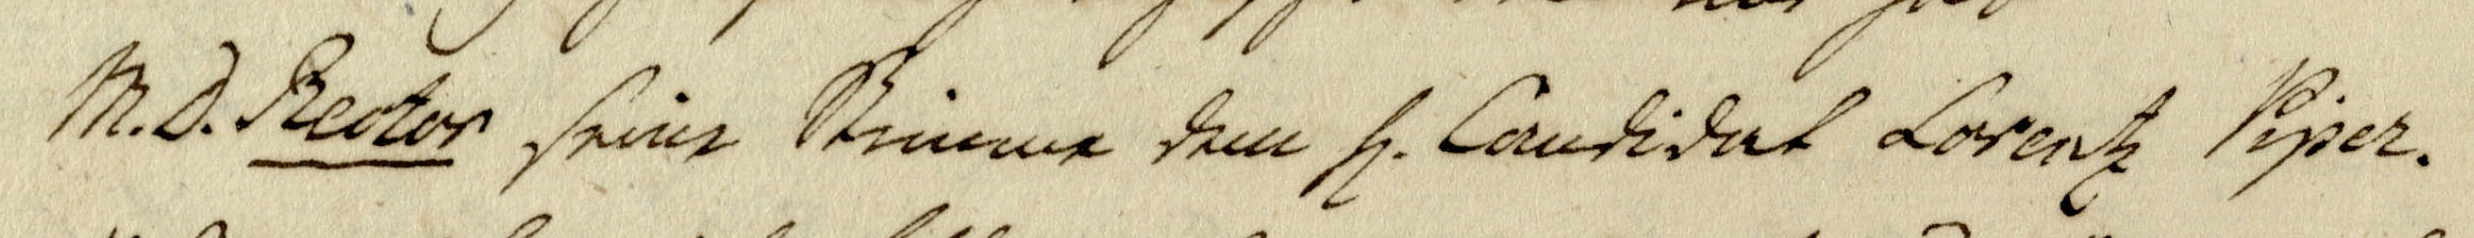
M. D. Rector seine Stimme dem h. Candidat Lorentz Piper.
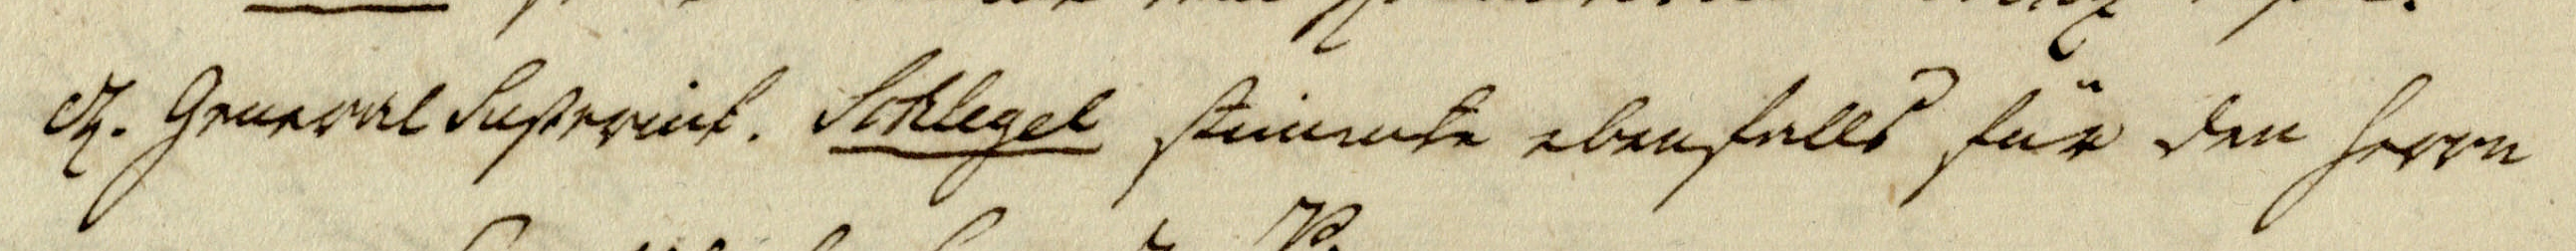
dh. General Superint. Schlegel stimmte ebenfalls für den Herrn
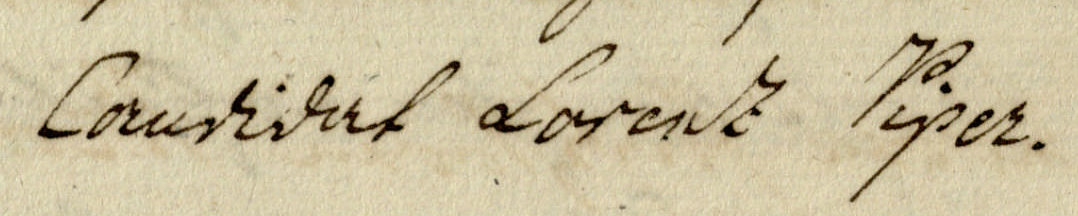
Candidat Lorenz Piper.
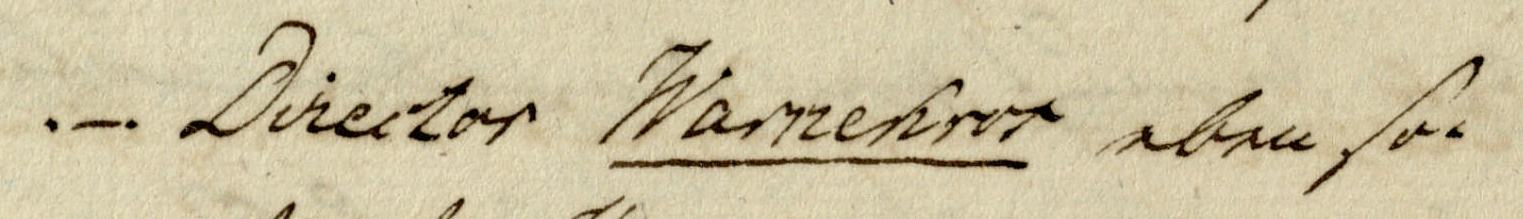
Director Warnekros eben so.
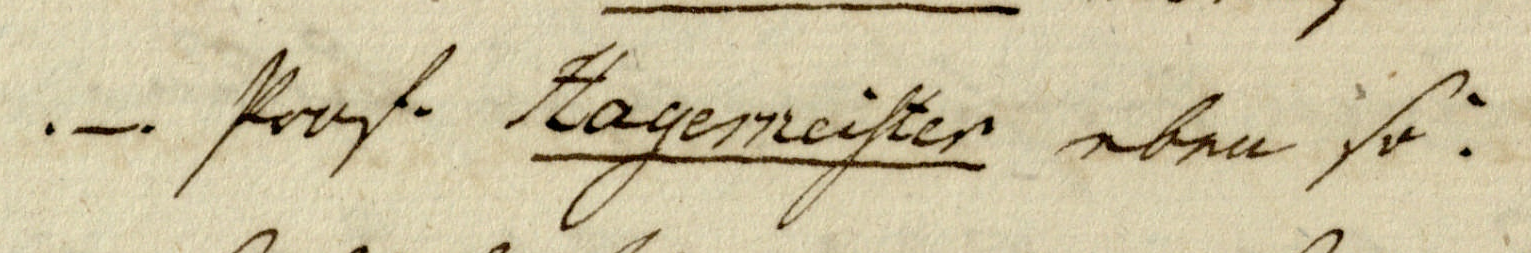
Prof. Hagemeister eben so
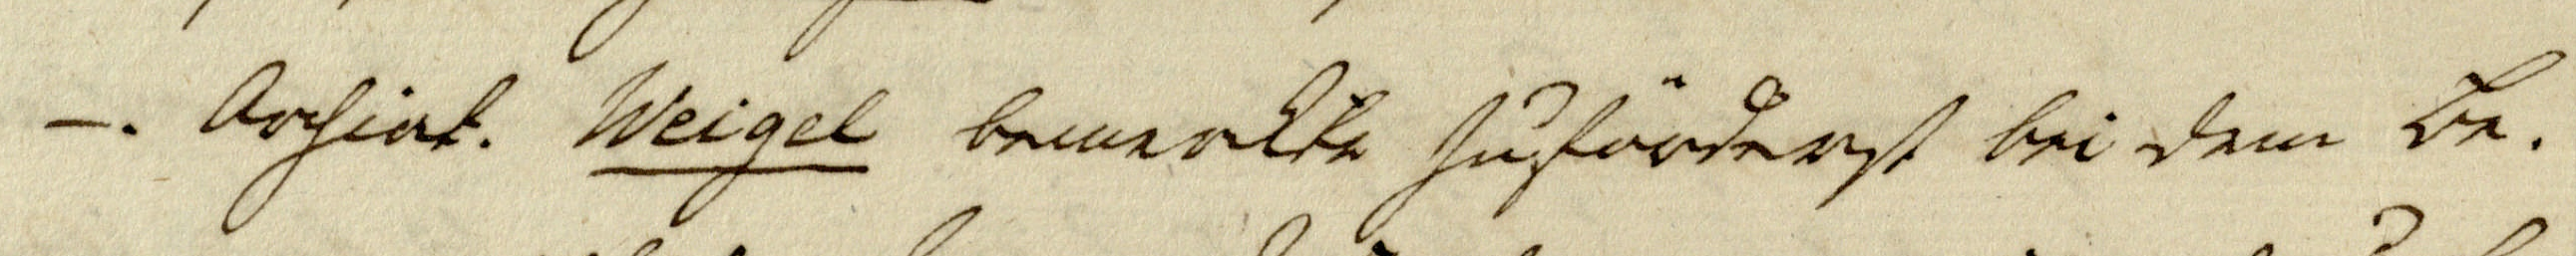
Archiat. Weigel bemerkte zuförderst bei dem Be¬
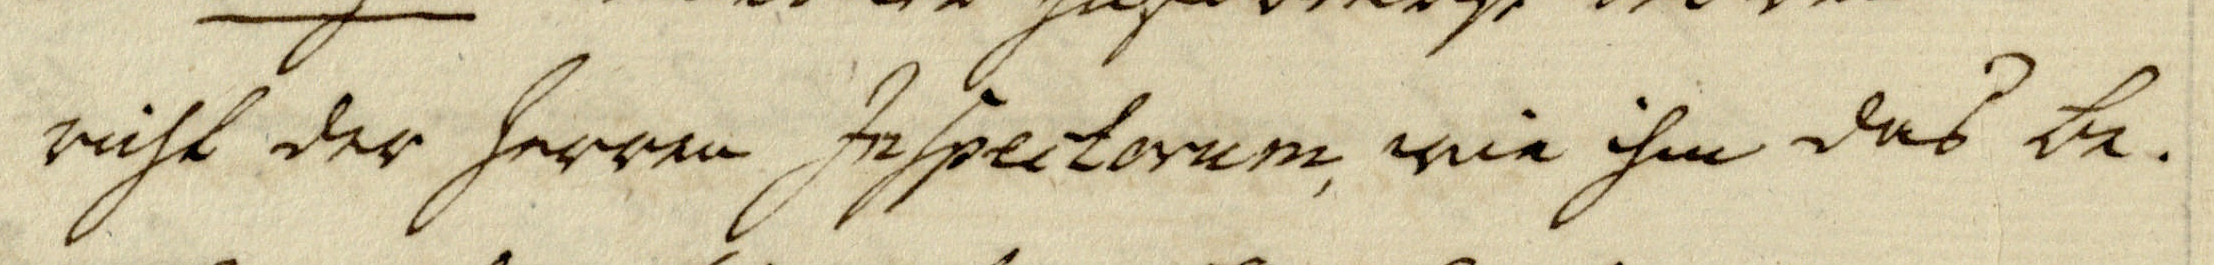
richt der Herren Inspectorum, wie ihm das Be¬
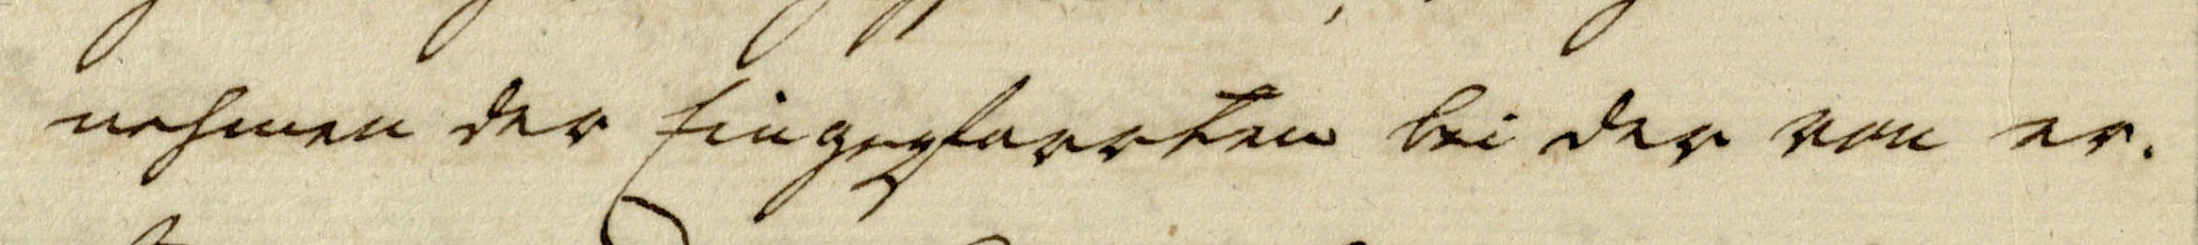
nehmen der Eingepfarrten bei der von er¬
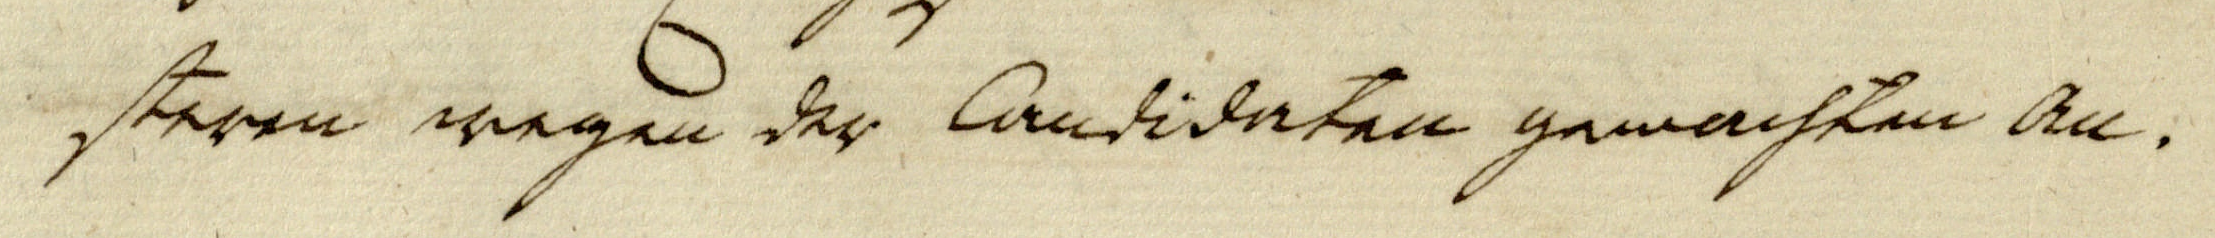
steren wegen der Candidaten gemachten An¬
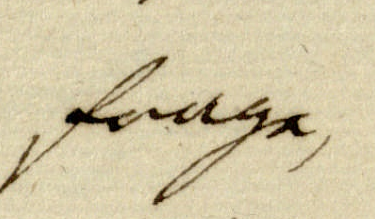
frage,
